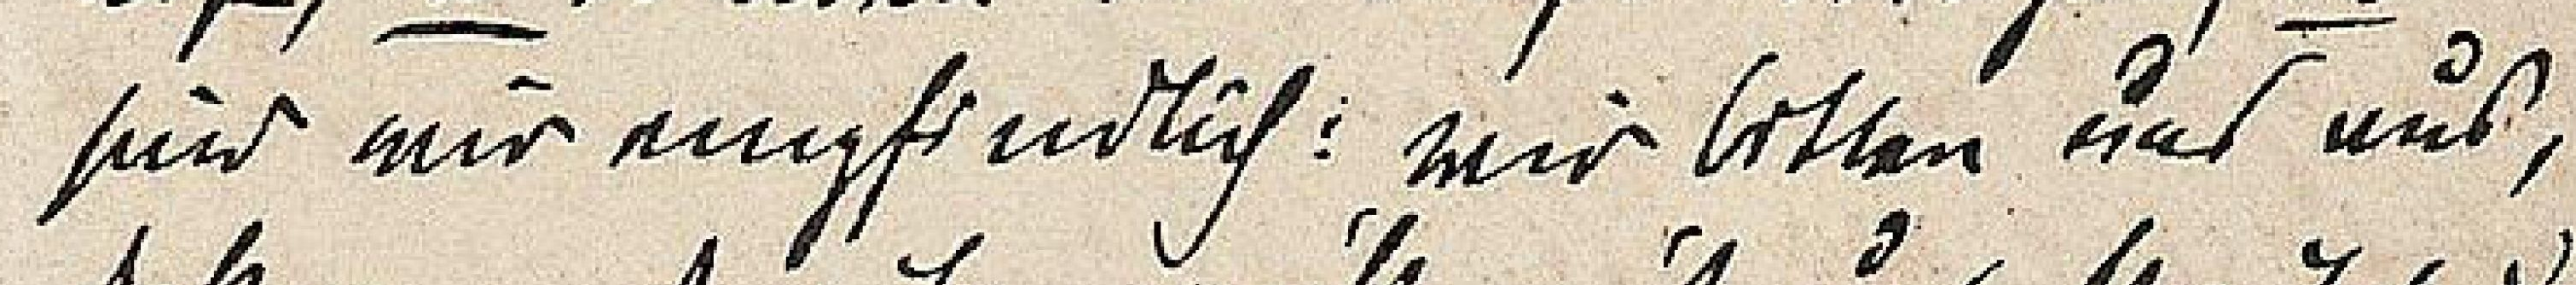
sind wir empfindlich: wird bitten uns aus,
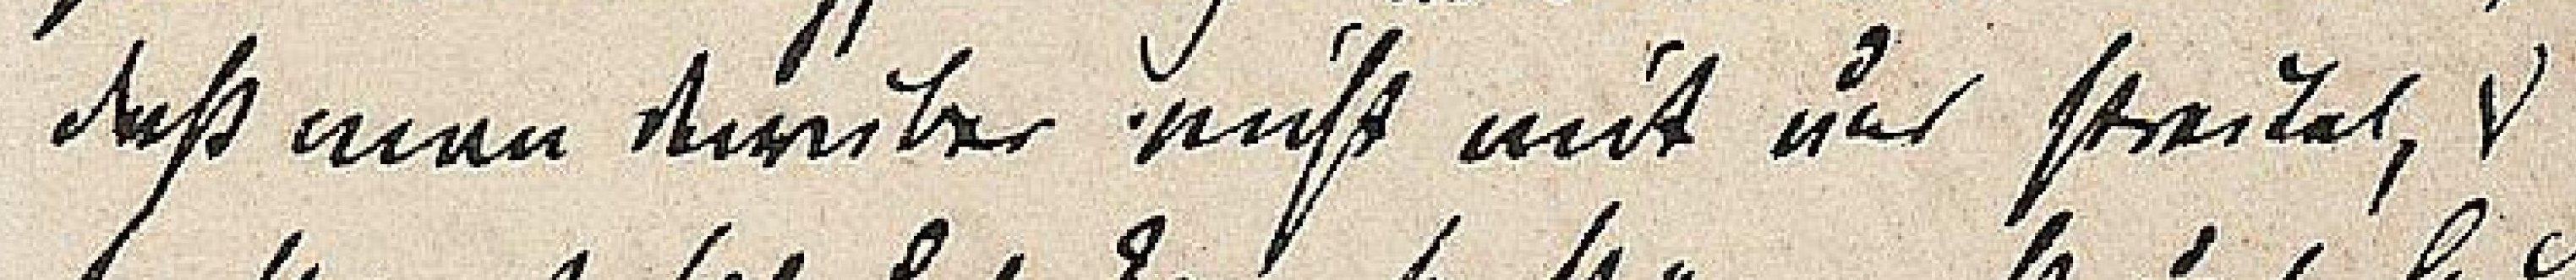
daß man darüber nicht mit uns streitet, V
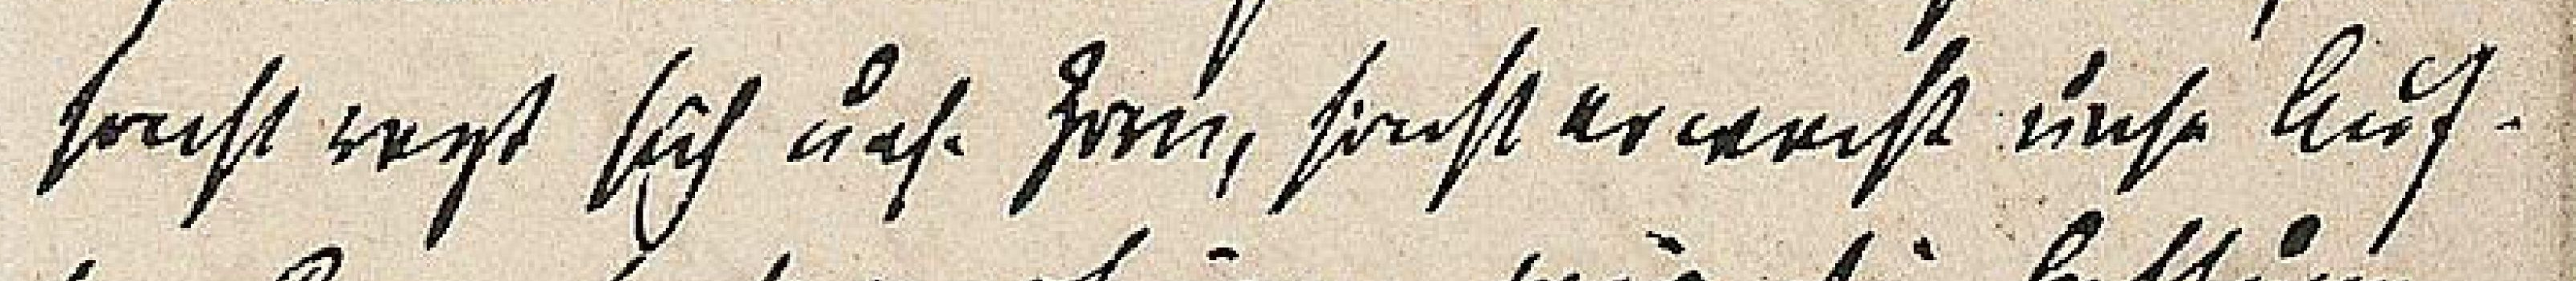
sonst regt sich unser Zorn, sonst erwacht unse Auf¬
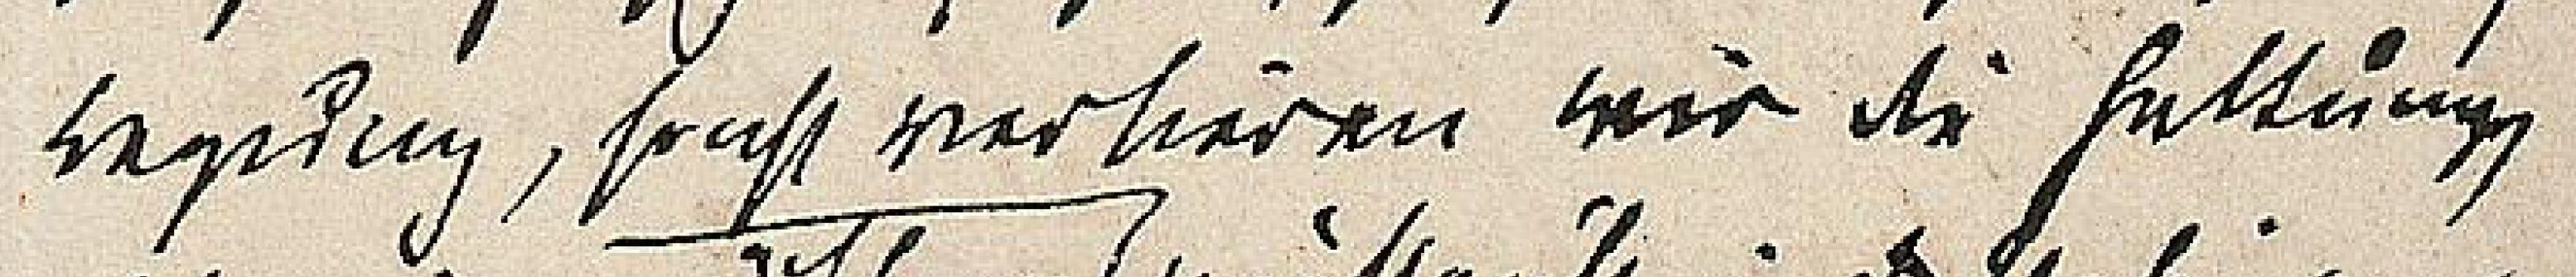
regung, sonst verlieren wir die Haltung,
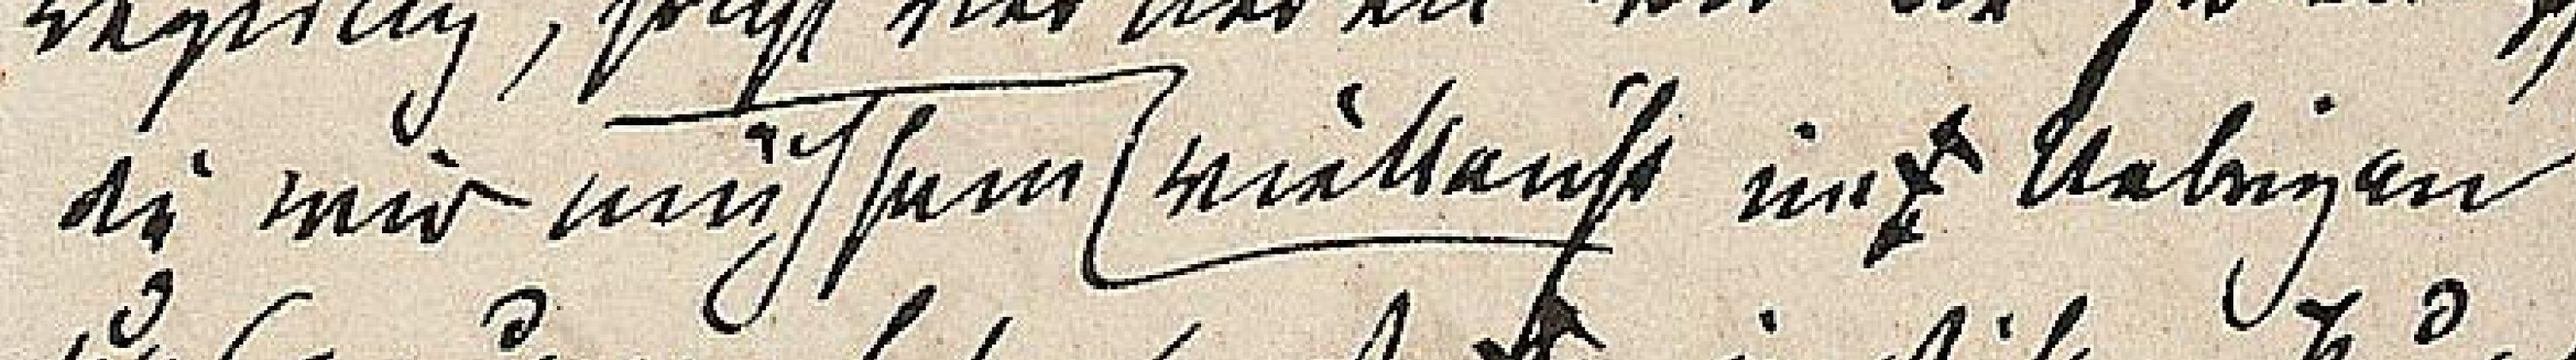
die wir mühsam vielleicht im Uebrigen
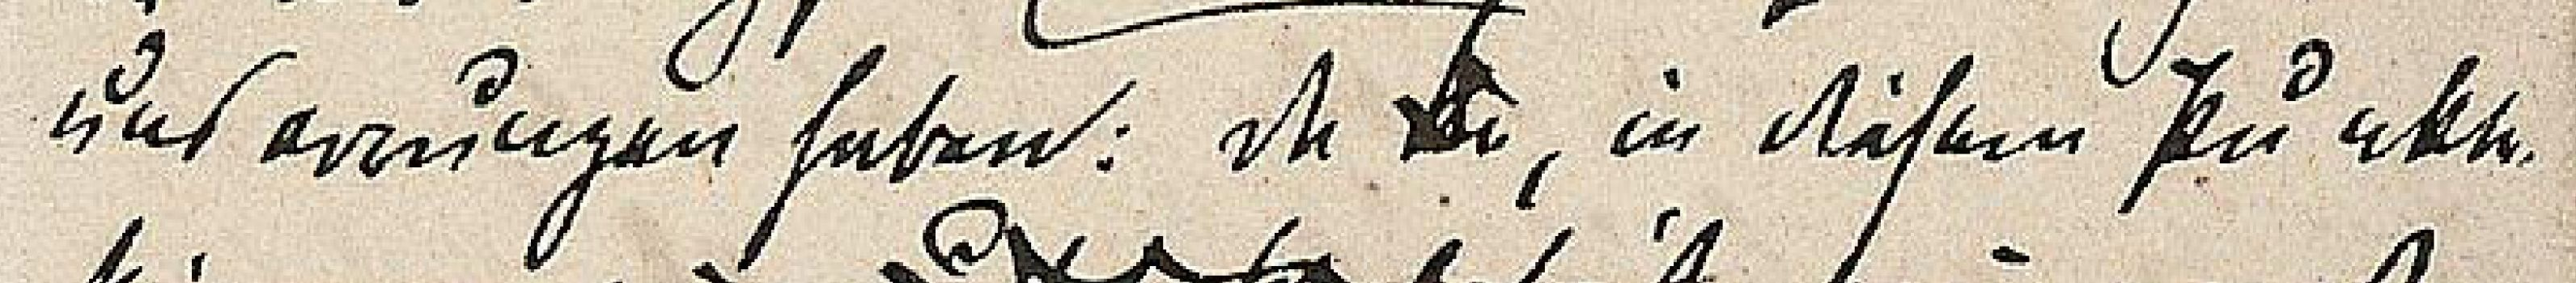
uns erungen haben: da an, in diesem Punkte
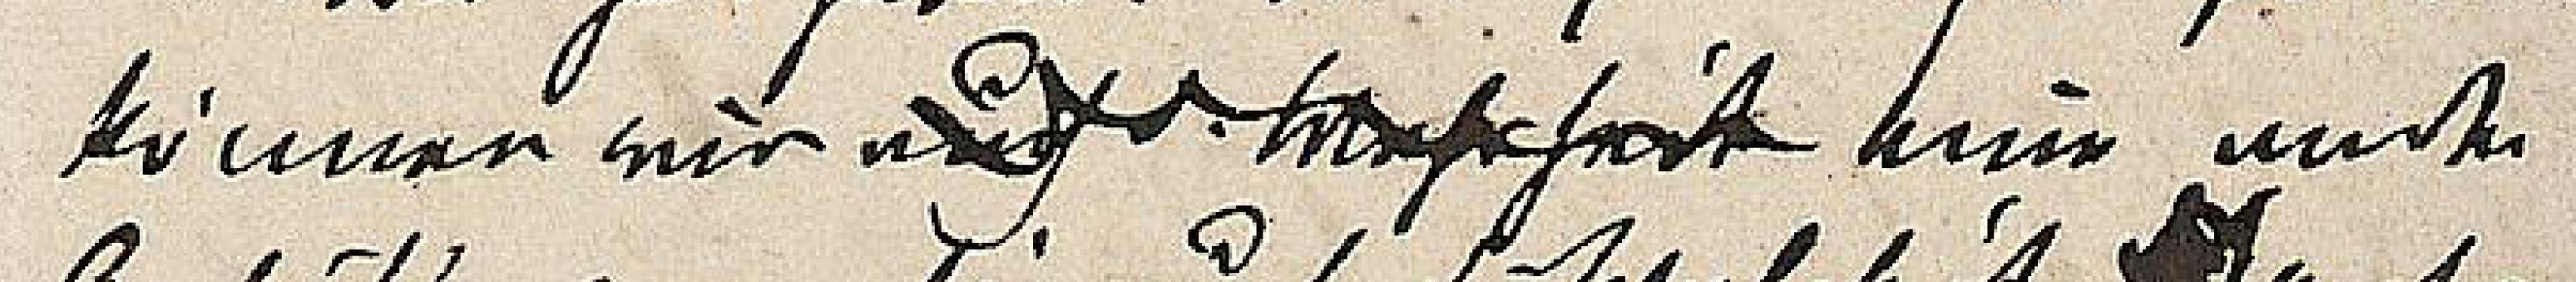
können wir auch d. Wahrheit eine ande
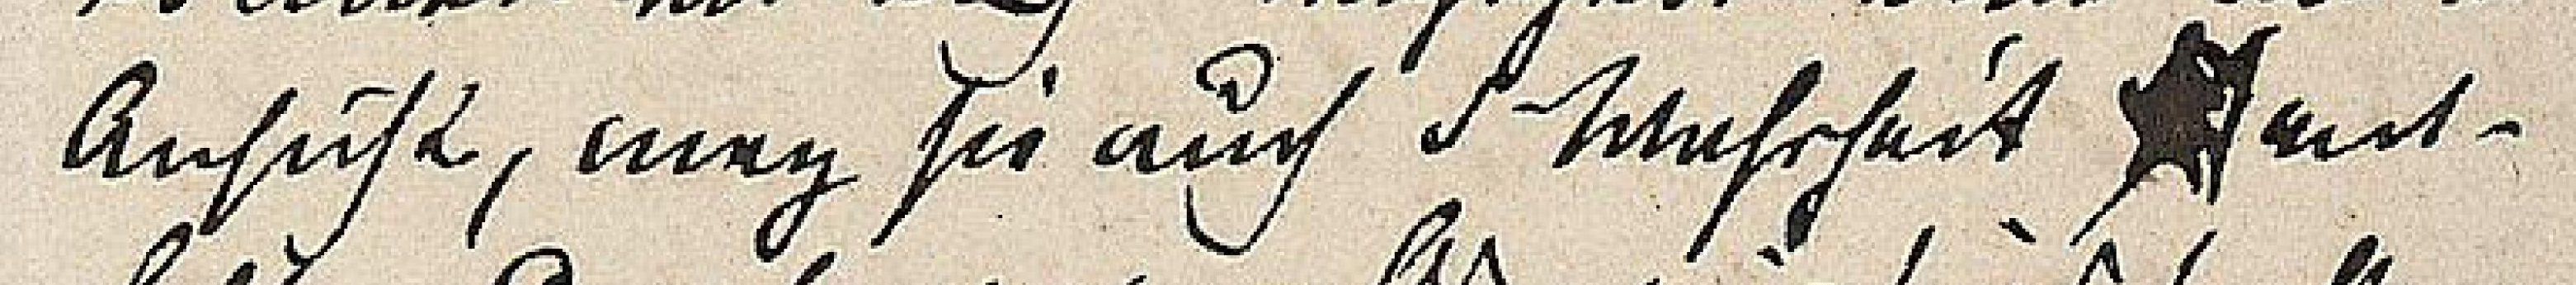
Ansicht, mag sie auch d. Wahrheit a ent¬
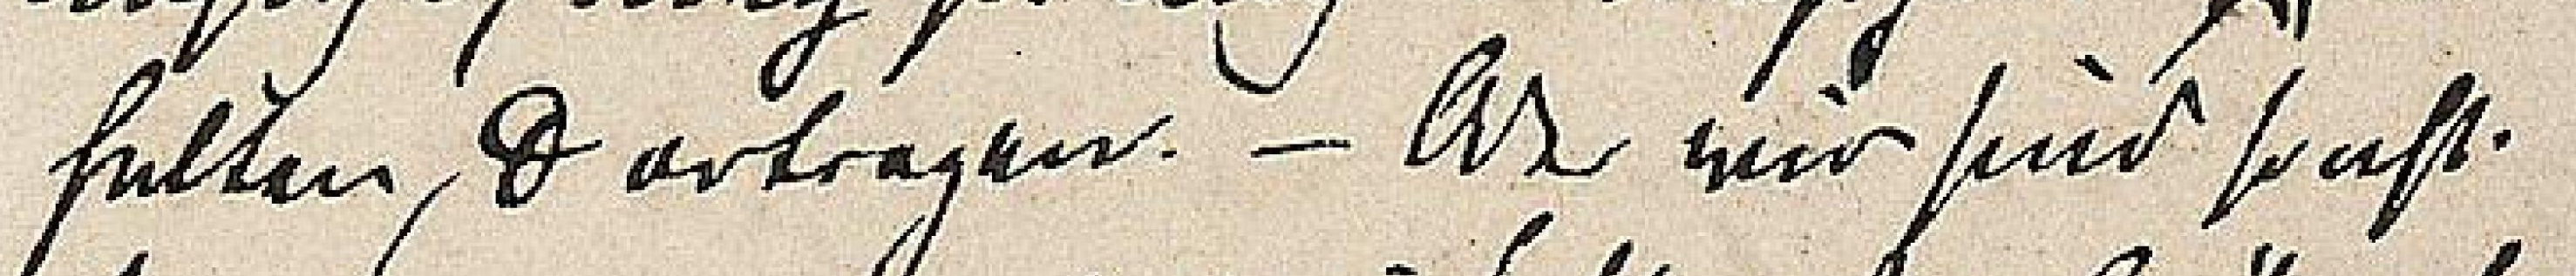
halten, o ertragen. _ Aber wir sind sonst
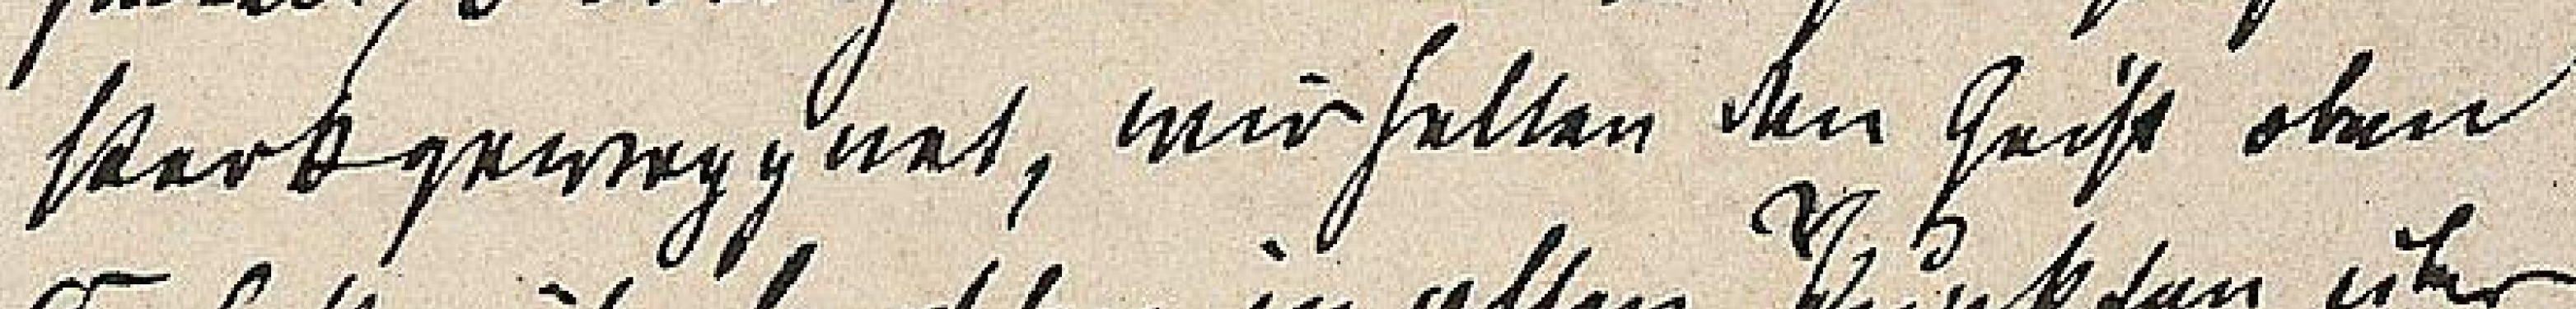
starkgewappnet, wir halten den Geist oben
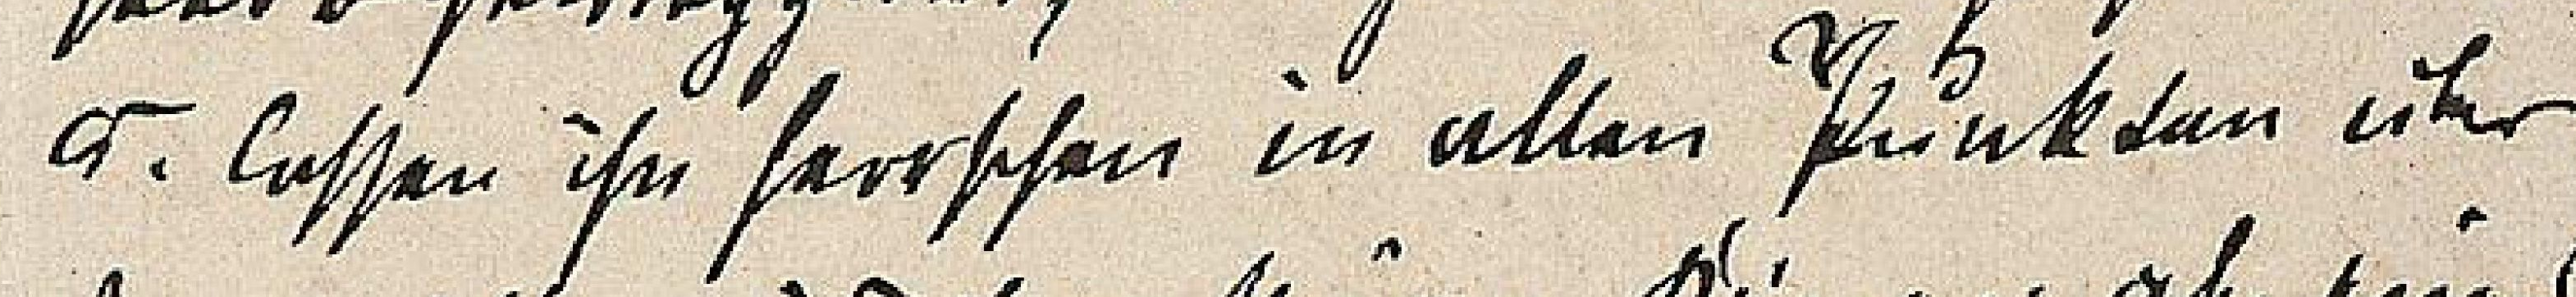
u. lassen ihn herrschen in allen Punkten über
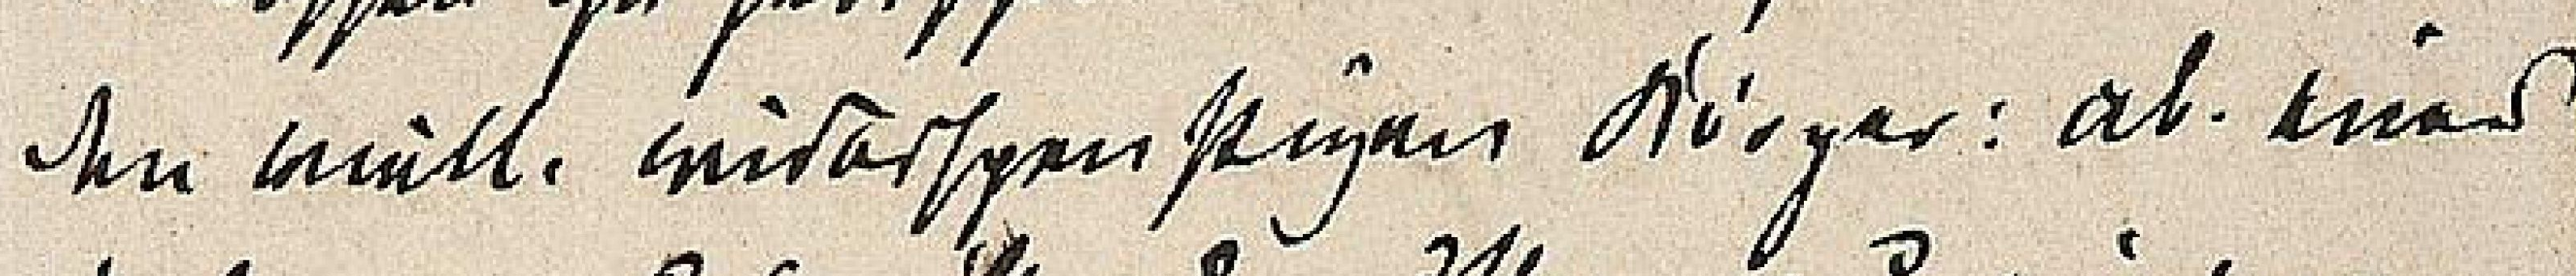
den viell. widerspenstigen Körper: ab. eines
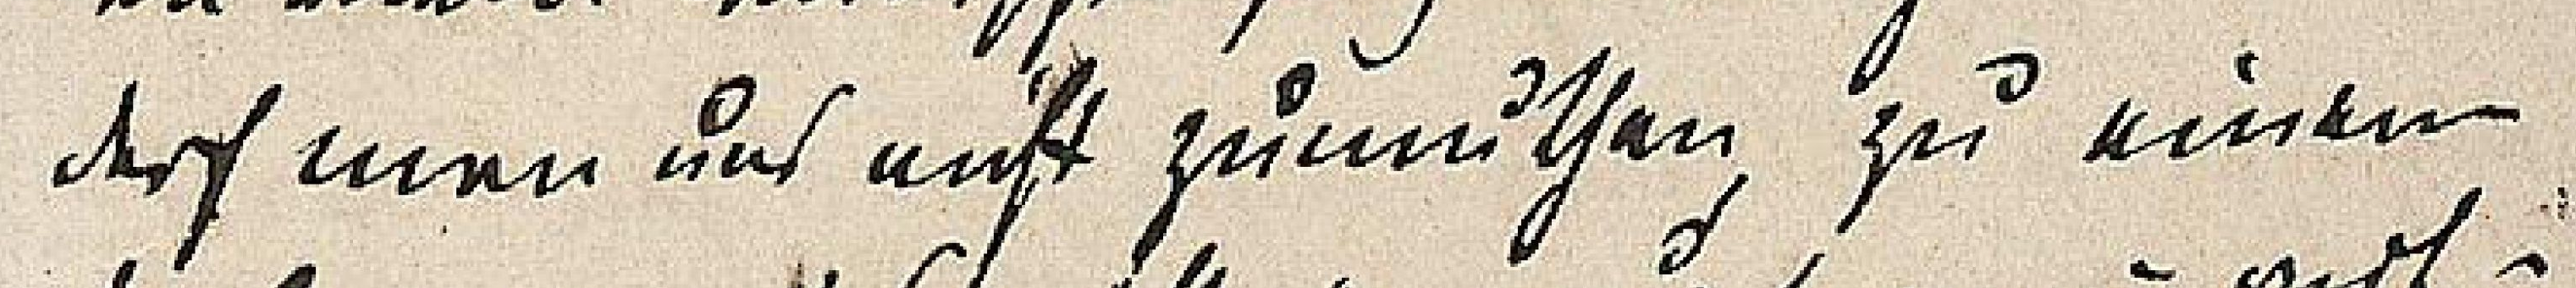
darf man uns nicht zumuthen, zu einem
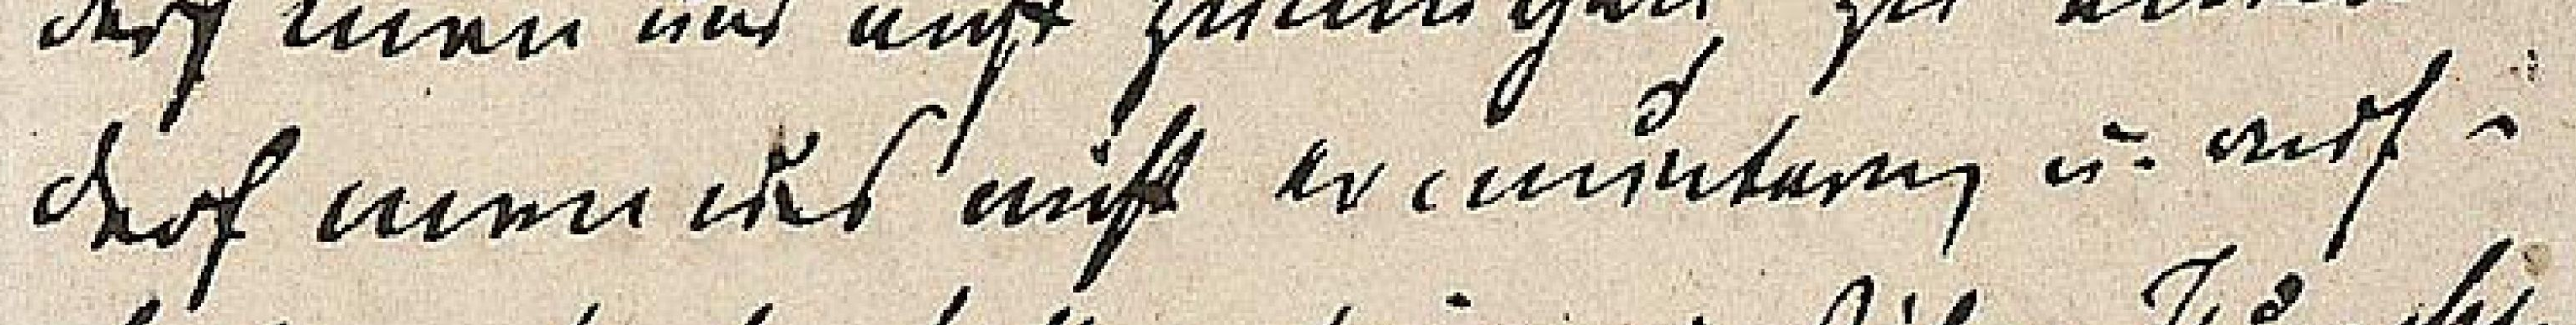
darf man uns nicht ermuntern, u. auf¬
